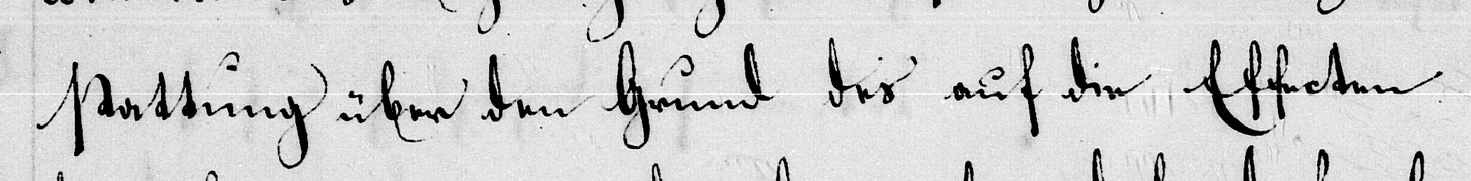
stattung über den Grund des auf die Effecten
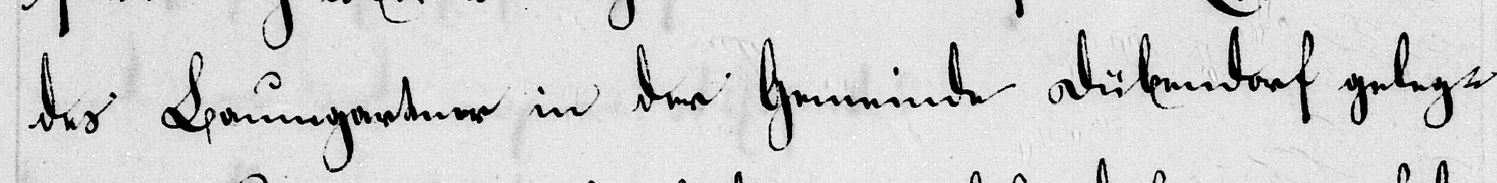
des Baumgartner in der Gemeinde Dübendorf geleg¬
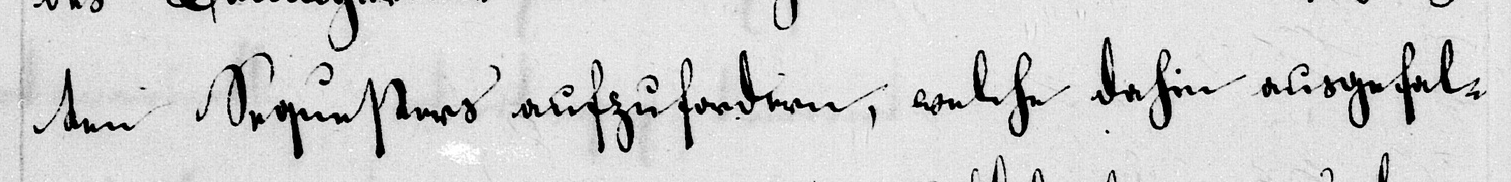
ten Sequesters aufzufordern, welche dahin ausgefal¬
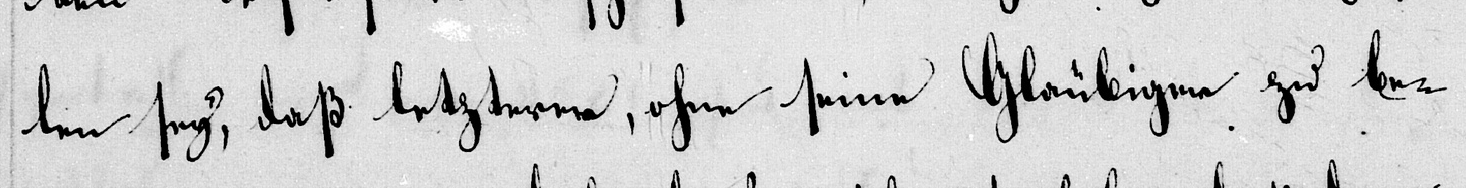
len sey, daß letzterer, ohne seine Gläubiger zu be¬
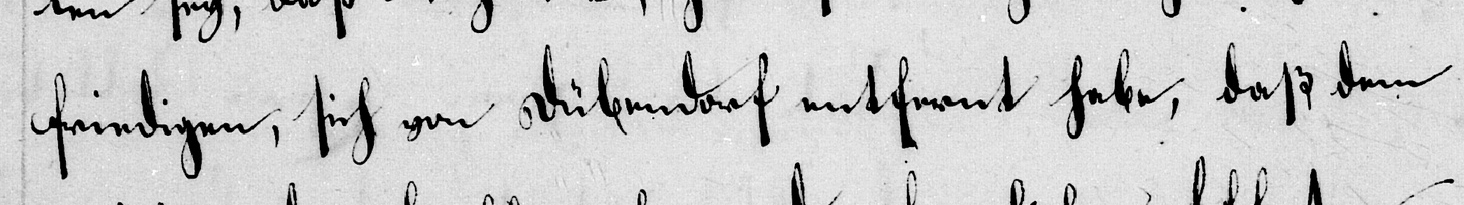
friedigen, sich von Dübendorf entfernt habe, daß dem
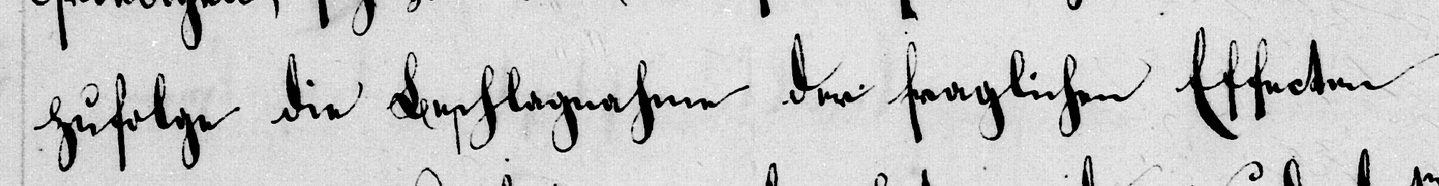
zufolge die Beschlagnahme der fraglichen Effecten
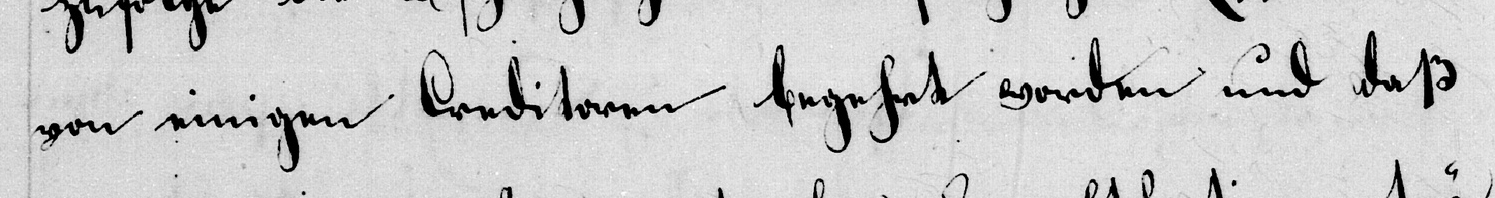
von einigen Creditoren begehrt worden und daß
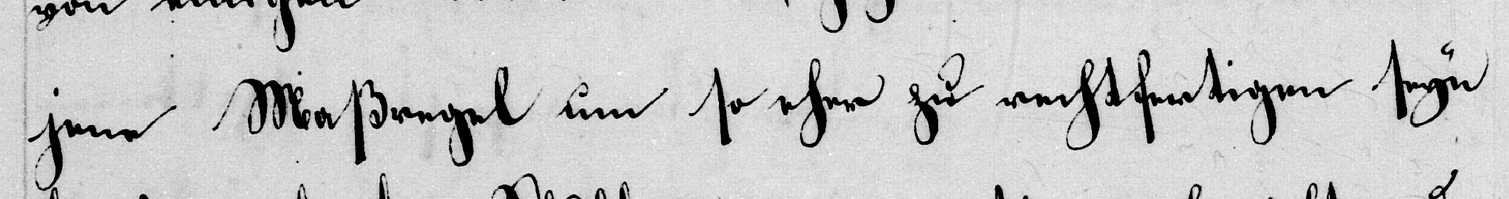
jene Maßregel um so eher zu rechtfertigen seyn
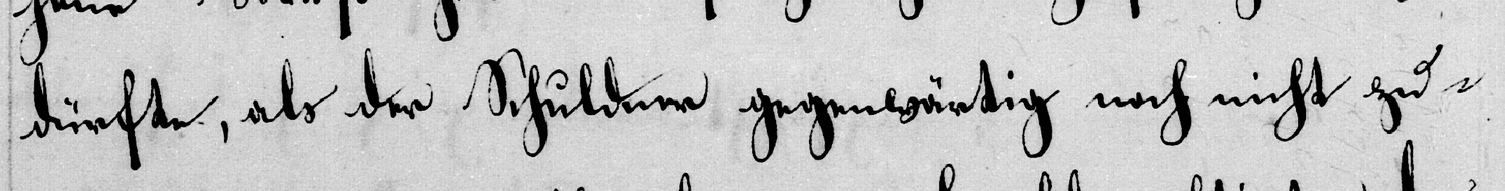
dürfte, als der Schuldner gegenwärtig noch nicht zu¬
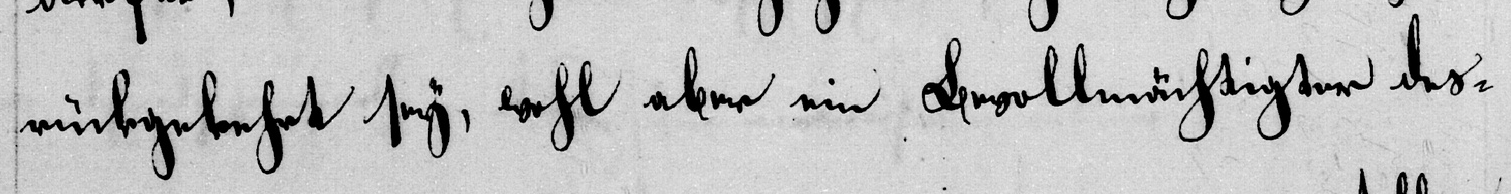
rückgekehrt sey, wohl aber ein Bevollmächtigter des-
